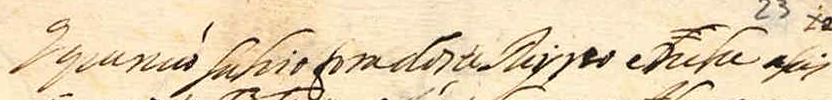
E que naõ sahio fora deste Reyno e nesse asis
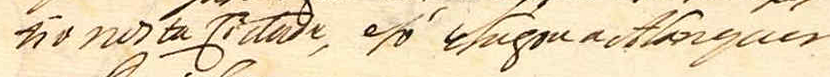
tio nesta Cidade, e só chegou a Alanquer
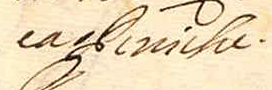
e a Peniche.
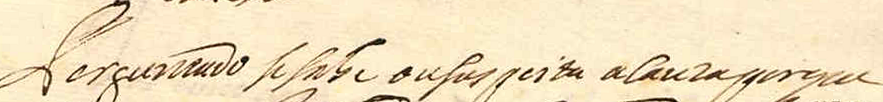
Perguntado se sabe ou suspeita a cauza porque
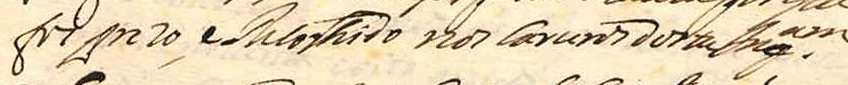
foi prezo, e Recolhido nos carceres desta Inq.am
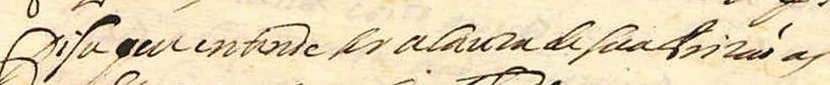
Disse que entende ser a cauza de sua Prizaõ as
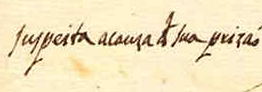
suspeita a cauza d̄ sua prizaõ
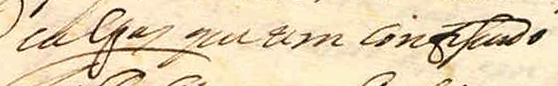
culpas que tem confessado
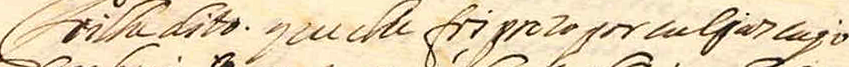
Foilhe dito. que elle foi prezo por culpas cujo
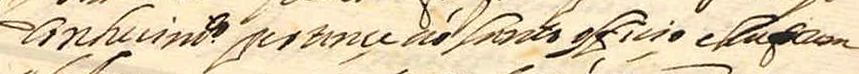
conhecim.to pertence ao santo officio e lhe fazem
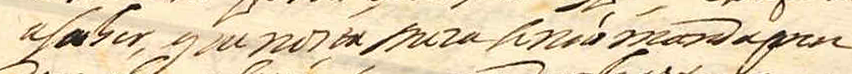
a saber, que nesta Meza se naõ manda pren
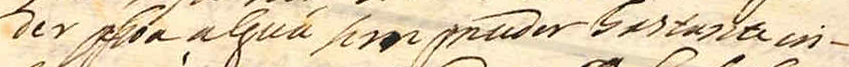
der pssoa alguā sem proceder bastante in
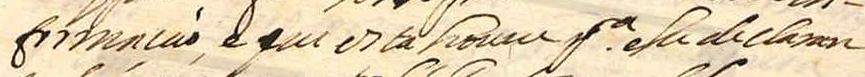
formaçaõ, e que esta houue p.a elle declaran
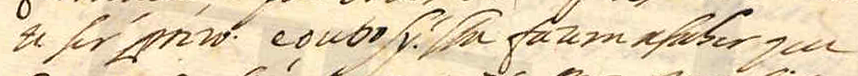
te ser prezo e outrosy. lhe fazem a saber que
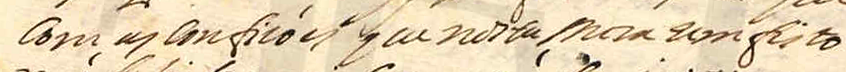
com as confições que nesta Meza tem feito
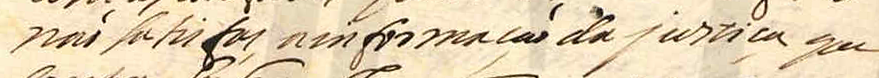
naõ satisfas, a informaçaõ da justiça que
